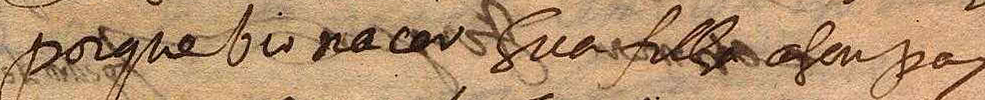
porque vio nacer hua filha a seu paj
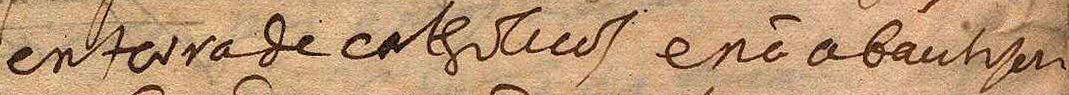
en terra de catholicos e nā a bautizou
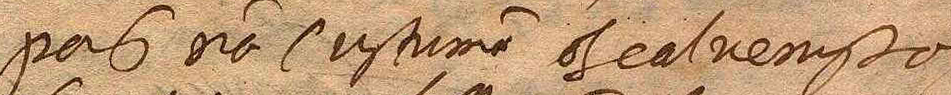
porq̄ nā custumā os caluenistas
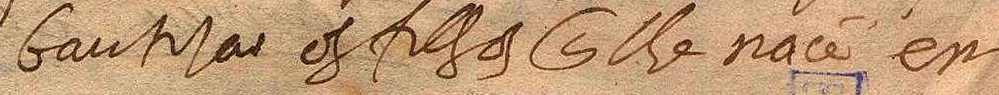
bautizar os filhos q̄ lhe nacē em
